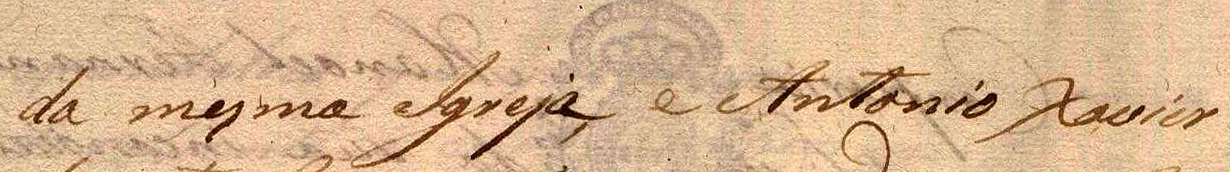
da mesma Igreja, e Antonio Xavier
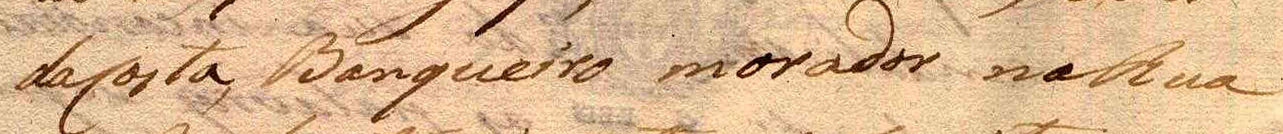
da Costa, Banqueiro morador na Rua
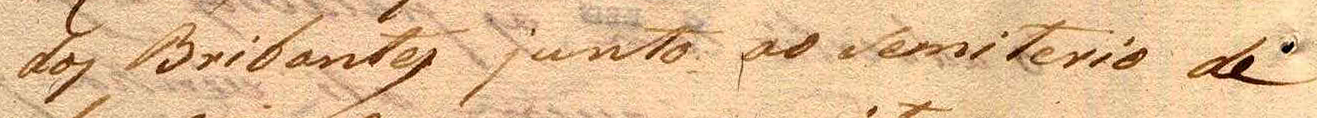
dos Bribantes junto ao semiterio de
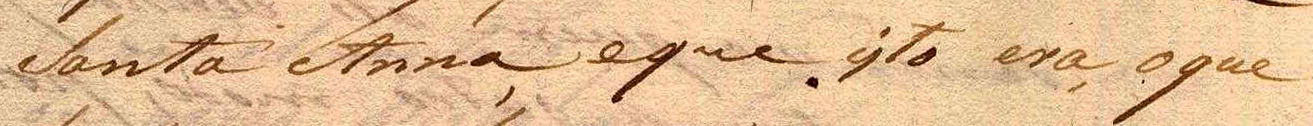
Santa Anna, e que isto era, o que
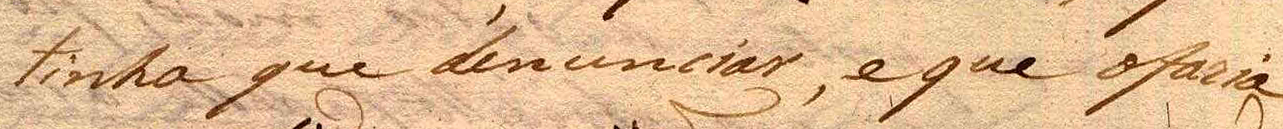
tinha que denunciar, e que o fazia
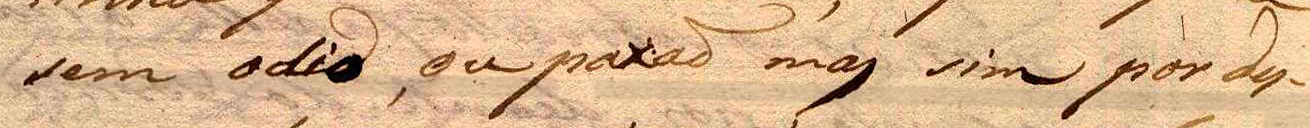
sem odio, ou paxaõ mas sim por des
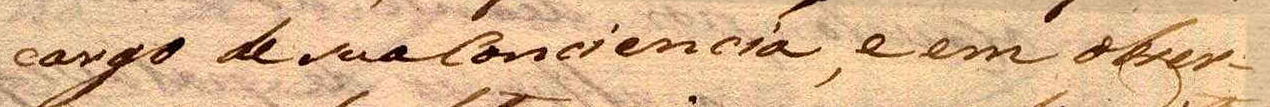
cargo de sua conciencia, e em obser
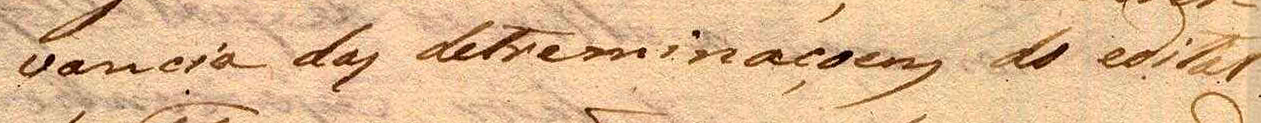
vancia das detreminaçoens do edital
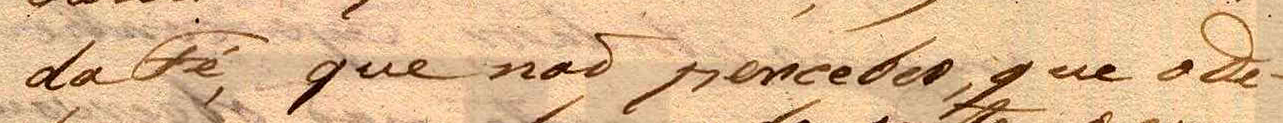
da Fé, que naõ percebeo, que o de
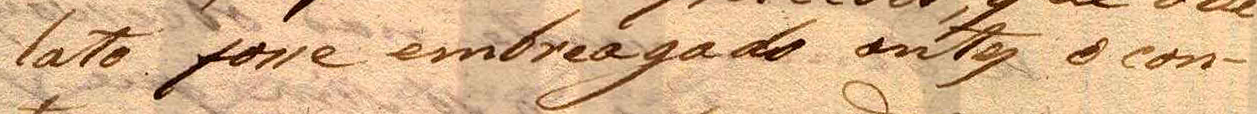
lato fosse embreagado antes o con
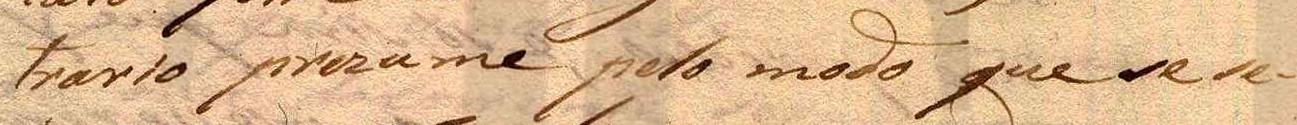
trario prezume pelo modo que se se
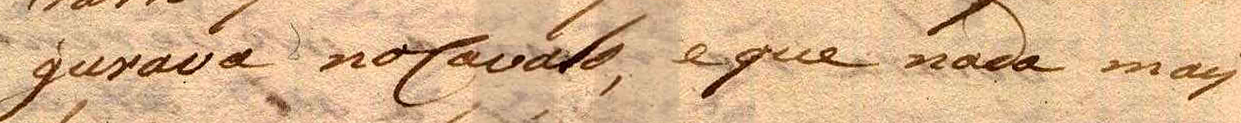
gurava no Cavalo, e que nada mais
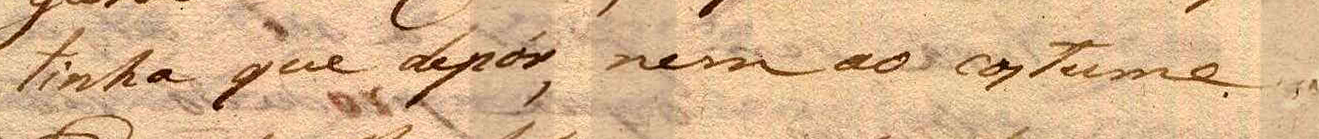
tinha que depór, nem ao costume
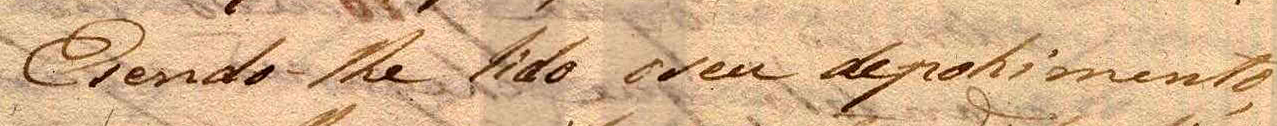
E sendo-lhe lido o seu depohimento,
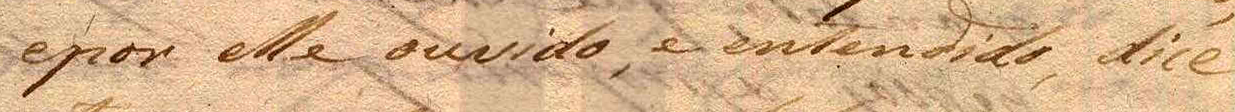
e por elle ouvido, e entendido dice
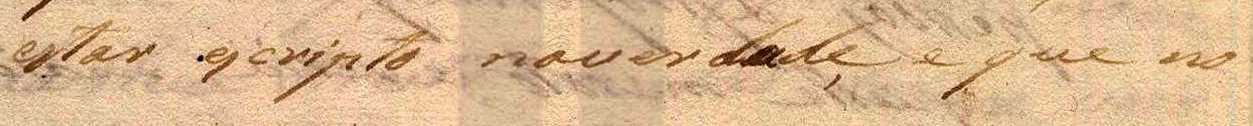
estar escripto na verdade, e que no
